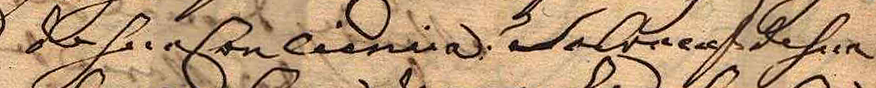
de sua Conciencia. Salvacaõ de sua
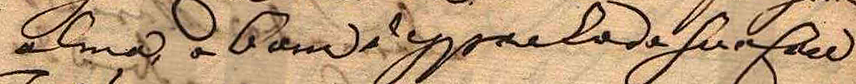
alma e bom despacho de sua Cau
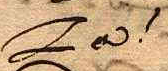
Za?
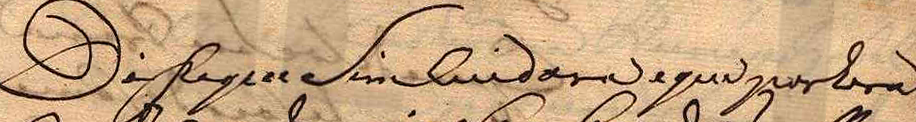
Disse que Sim Cuidara, e que por hora
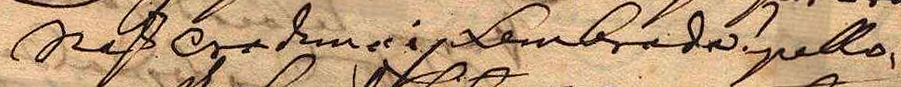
naõ era de mais Lembrada pello,
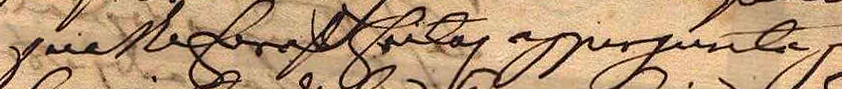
que lhe foraõ feitas as perguntas
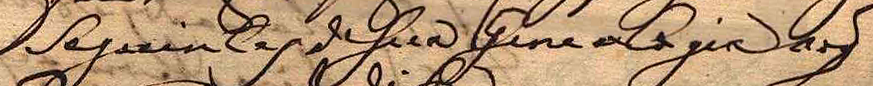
seguintes de sua Genealogia ao q̄
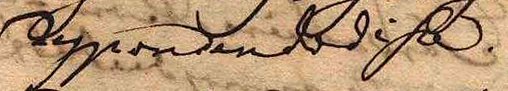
Respondendo disse.
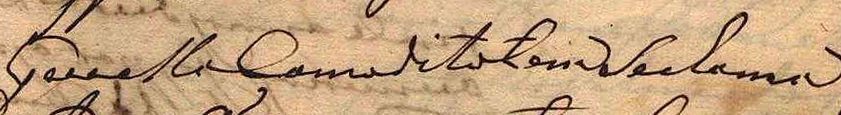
Que ella Como dito tem Se chama
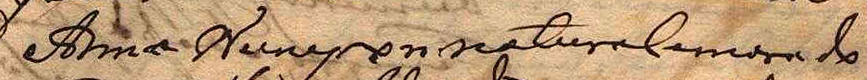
Anna Nunes x n natural e morado
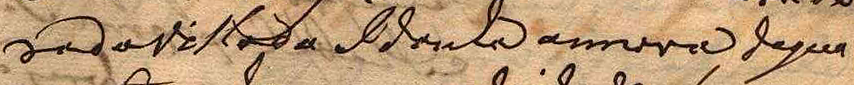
ra da Villa da Idanha a nnova de qua
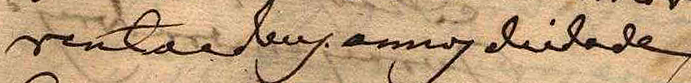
renta e dous annos de idade
